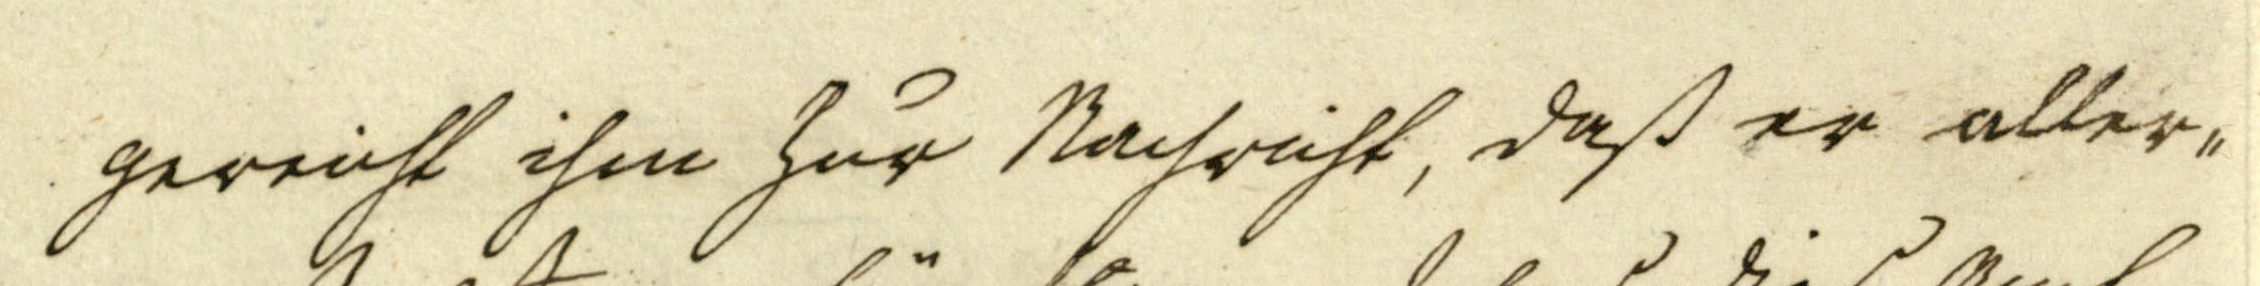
gereicht ihm zur Nachricht, daß er aller¬
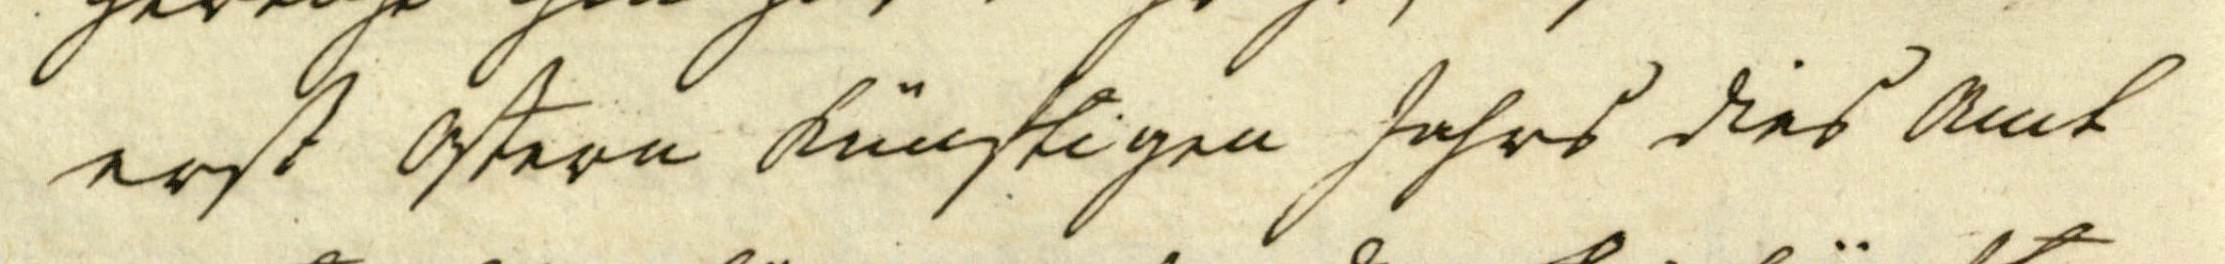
erst Ostern künftigen Jahrs dies Amt
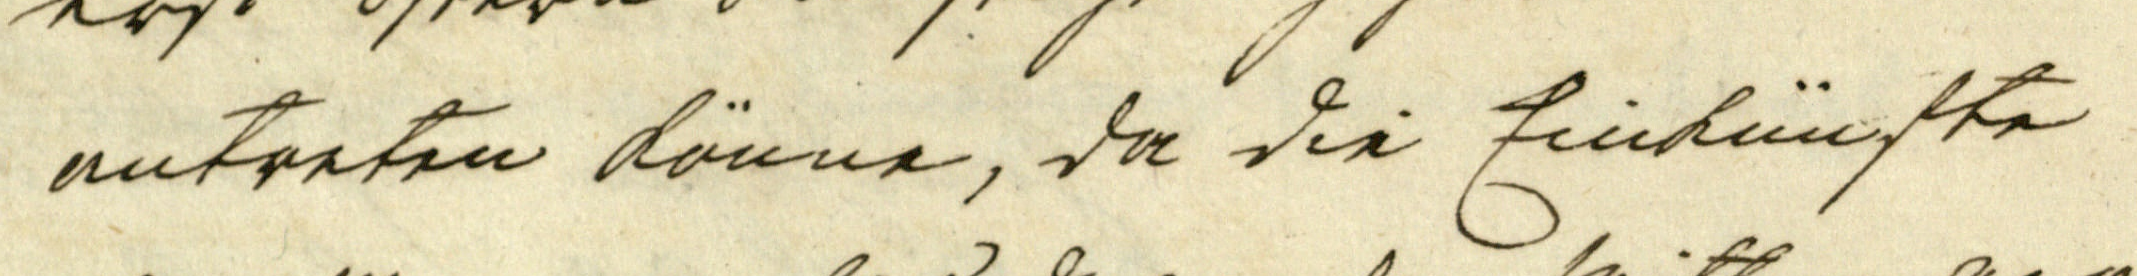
antreten könne, da die Einkünfte
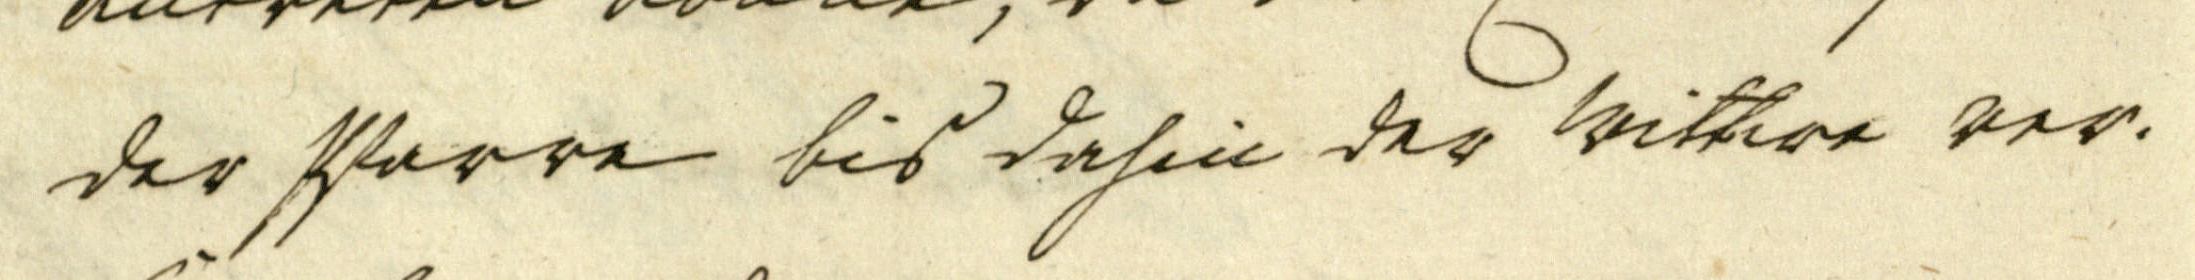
der Pfarre bis dahin der Wittwe ver¬
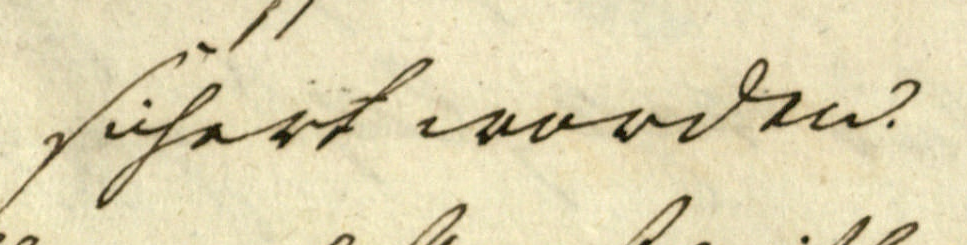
sichert worden.
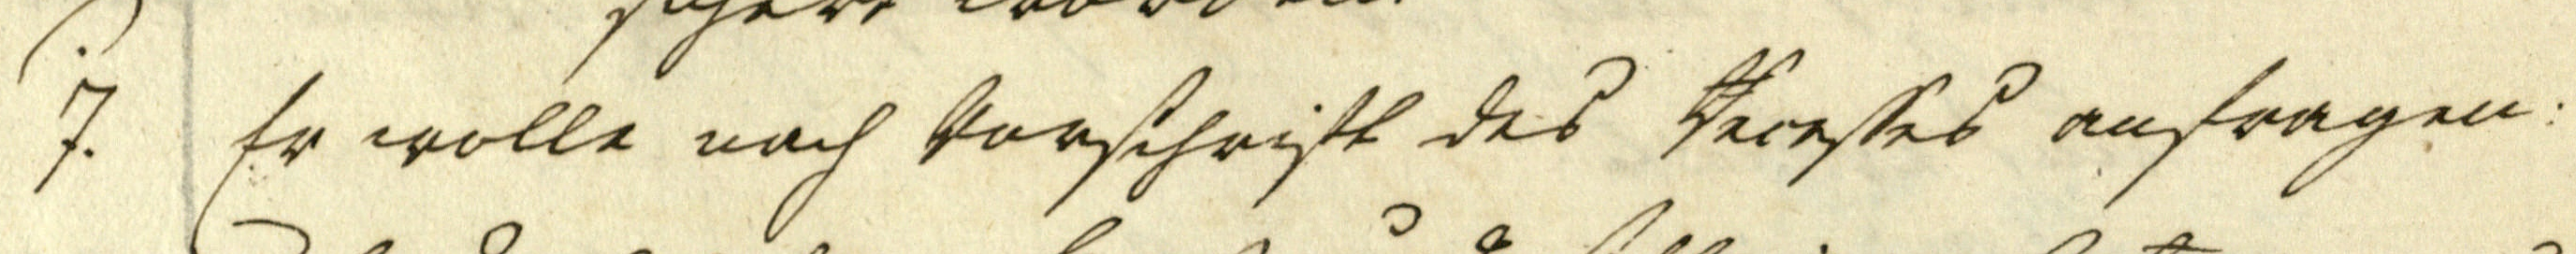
7. Er wolle nach Vorschrift des Recesses anfragen:
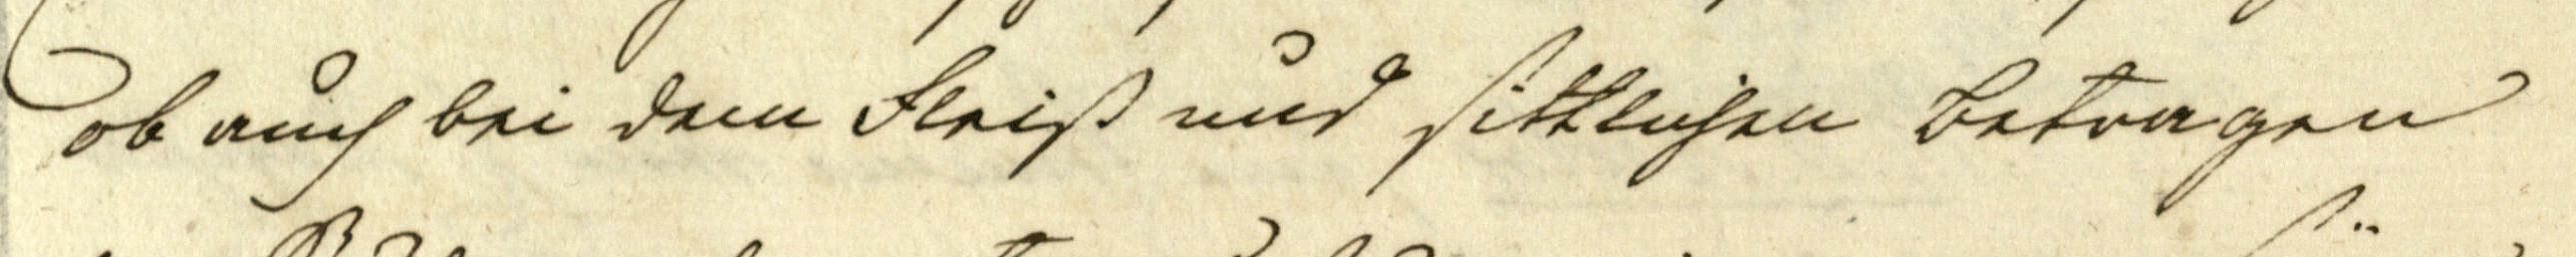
ob auch bei dem Fleiß und sittlichen Betragen
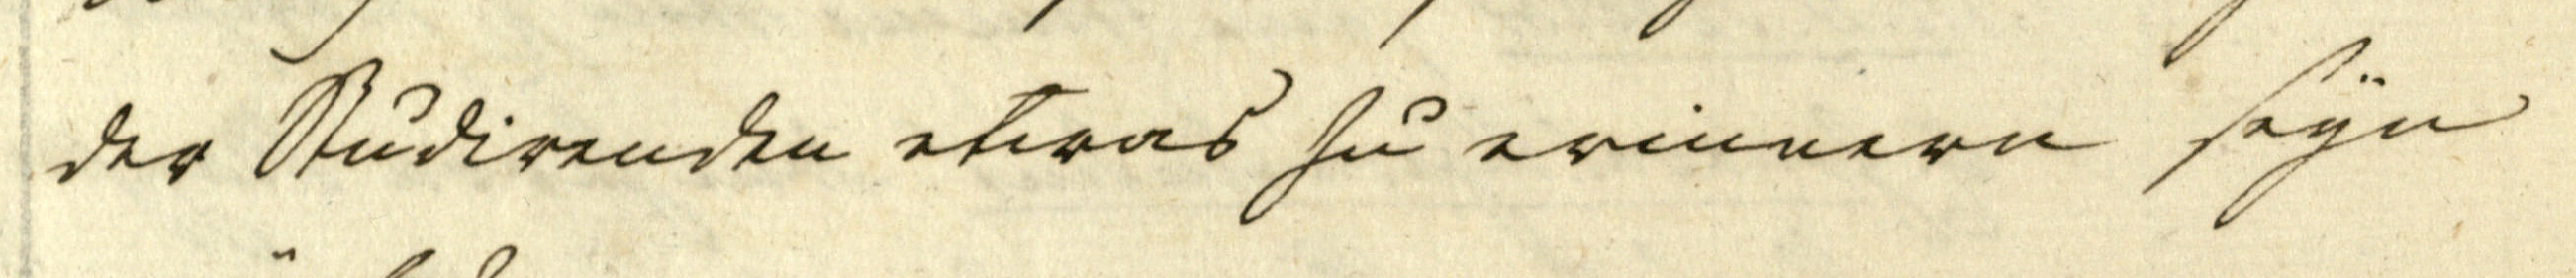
der Studirenden etwas zu erinnern seÿn
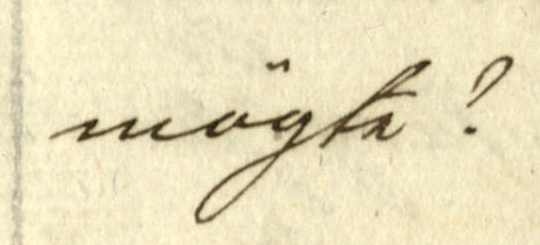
mögte ?
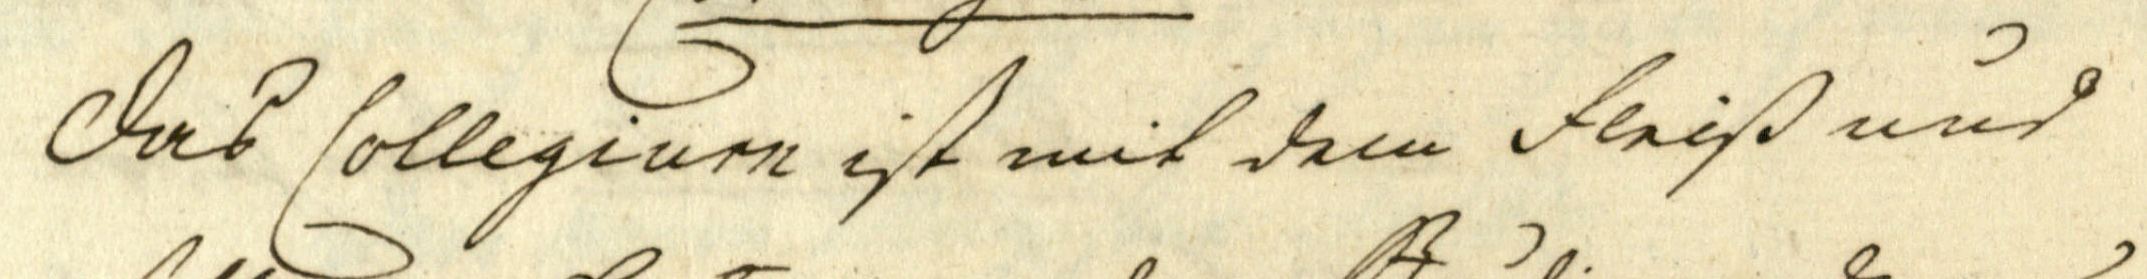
Das Collegium ist mit dem Fleiß und
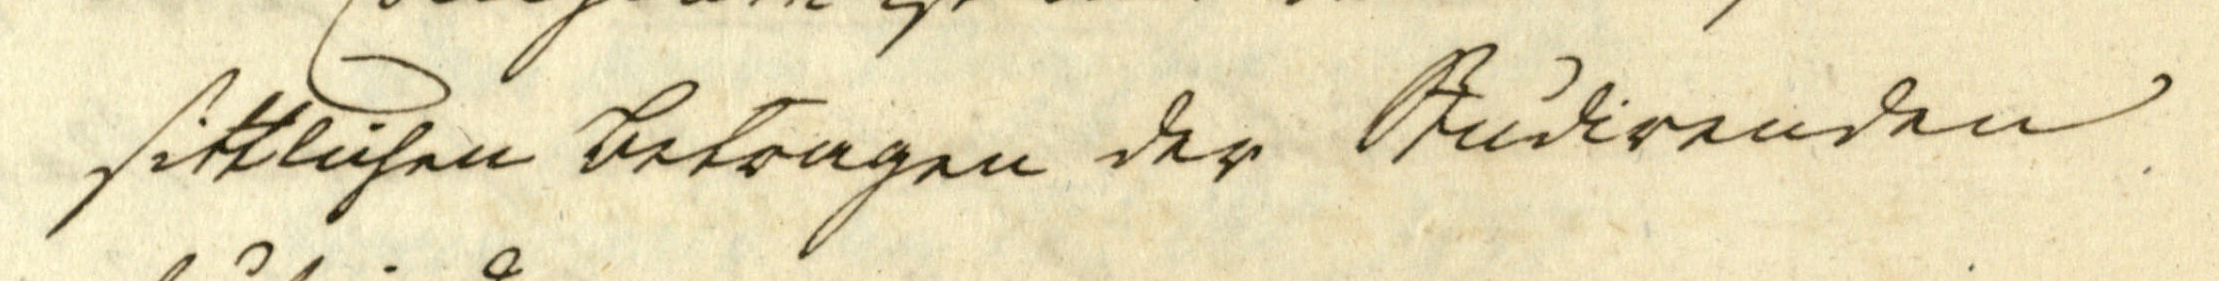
sittlichen Betragen der Studirenden
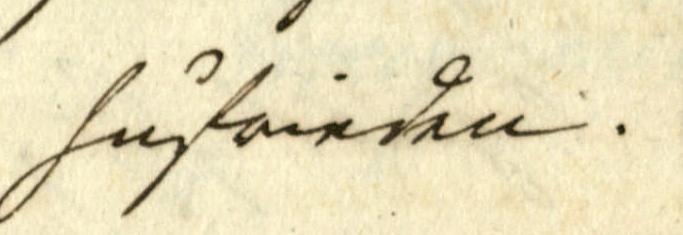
zufrieden.
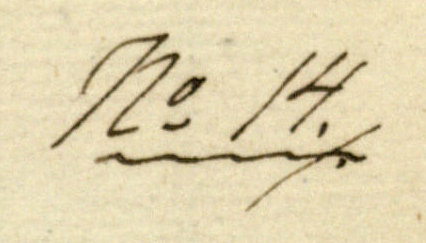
No 14 .
